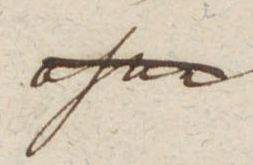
rechnen
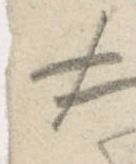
sind,
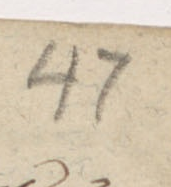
182.
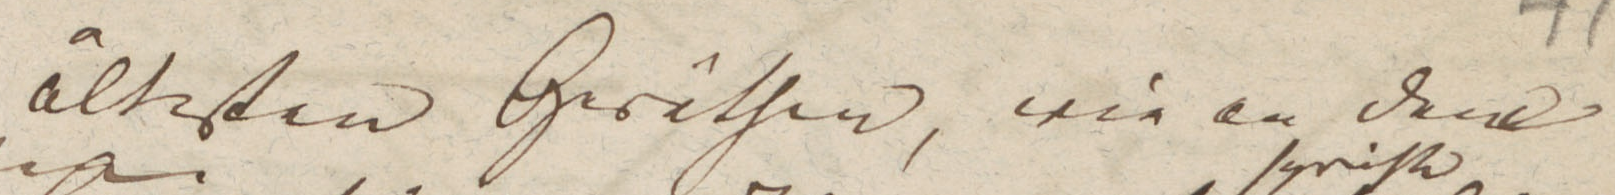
ältesten Geräthen, wie an denm
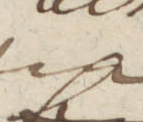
dargestellten
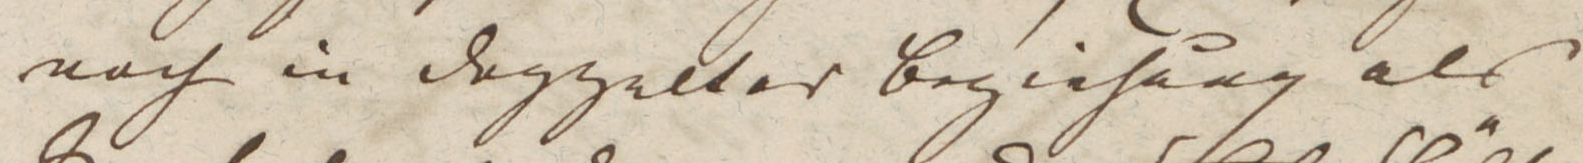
noch in doppelter Beziehung als
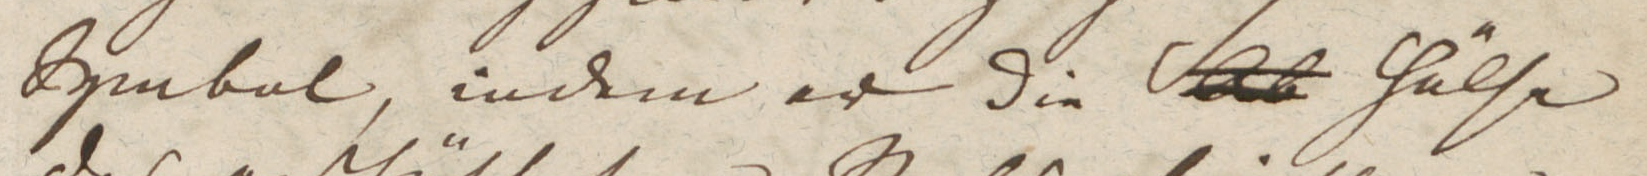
Symbol, indem er die Ab Hülse
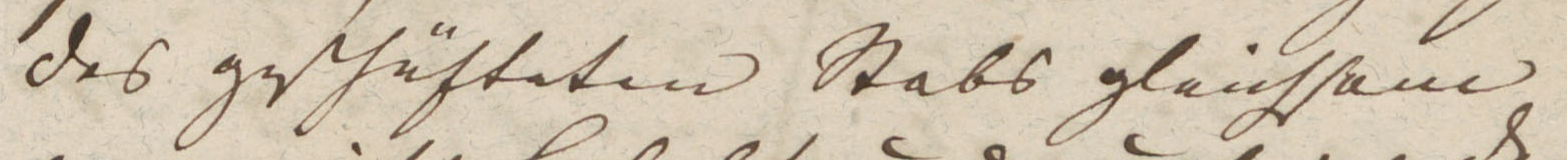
des geschäfteten Stabs gleichsam
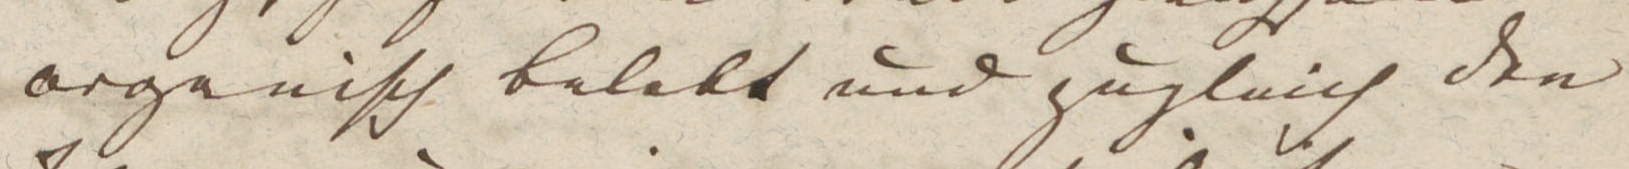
organisch belebt und zugleich den
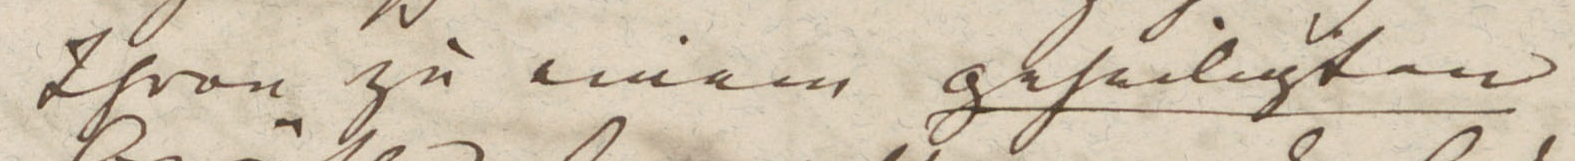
Thron zu einem geheiligten
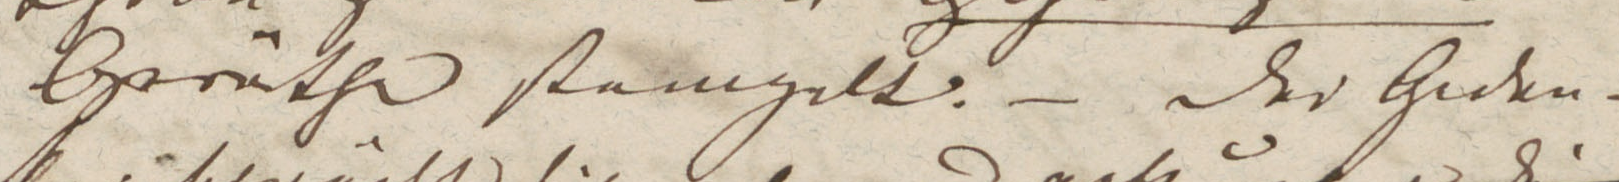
Geräthe stempelt. – Der Gedan-
